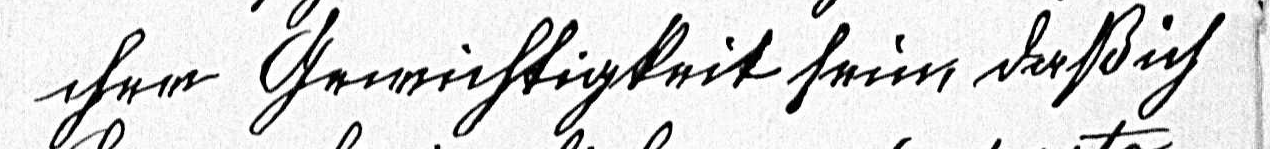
cher Gerichtigkeit sein, daß ich
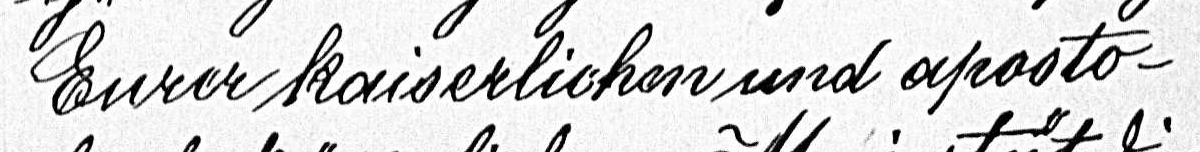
Eurer kaiserlichen und aposto¬
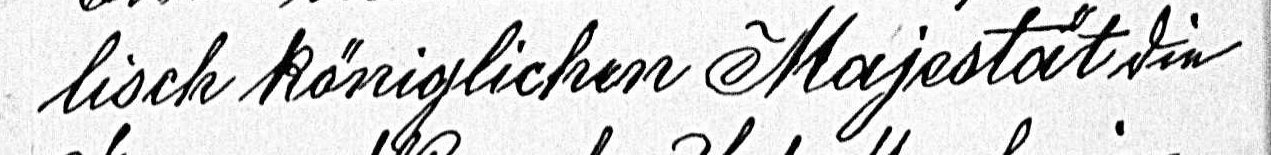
lisch königlichen Majestät die
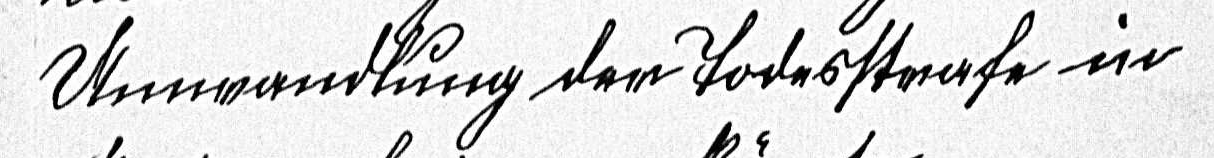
Umwandlung der Todesstrafe in
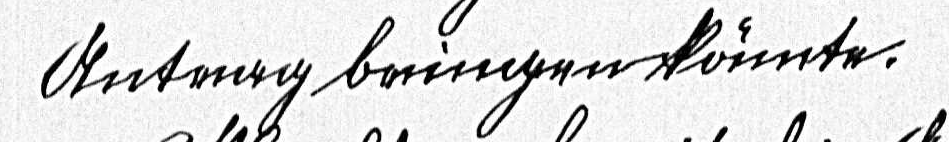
Antrag bringen könnte.
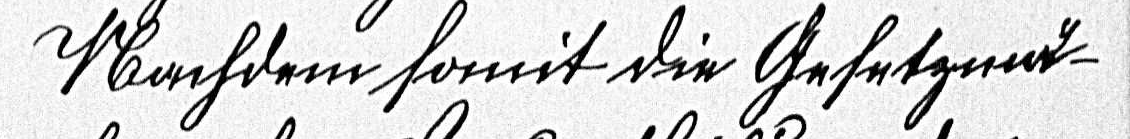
Nachdem somit die Gesetzmä¬
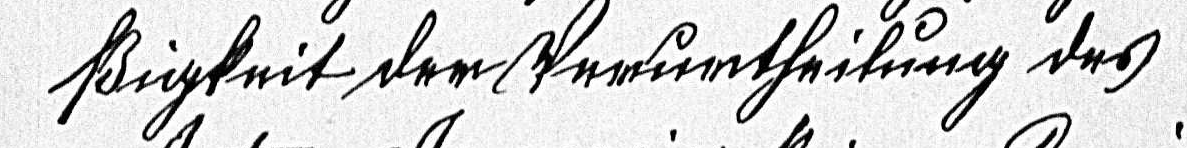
ßigkeit der Verurtheilung des
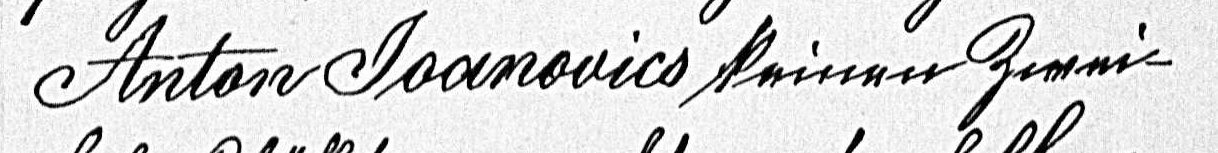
Anton Ioanovics keinen Zwei¬
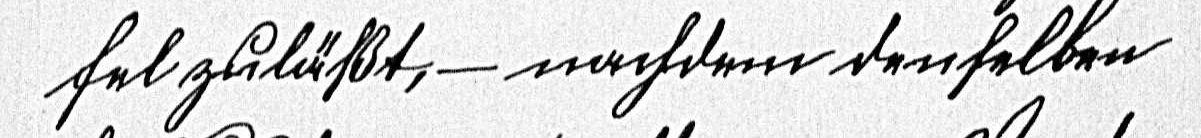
fel zuläßt, nachdem denselben
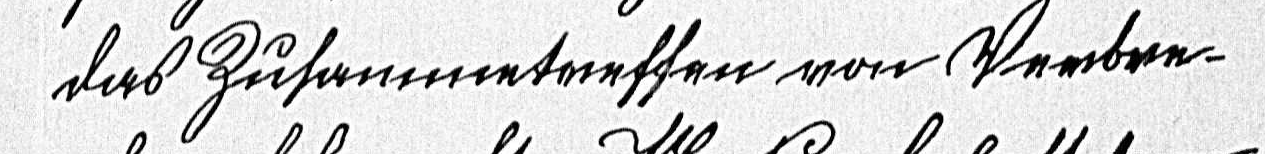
das Zusammentreffen von Verbre¬
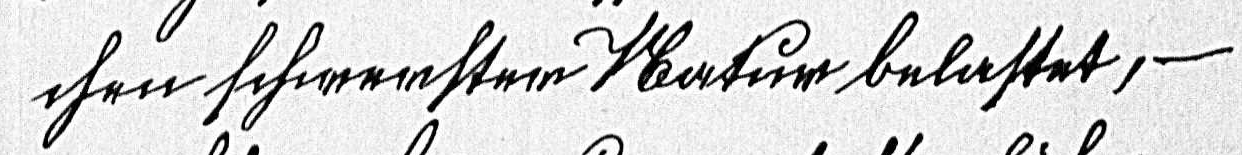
chen schwerster Natur belastet,
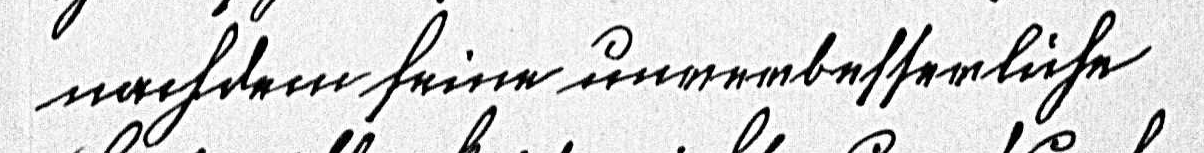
nachdem seine unverbesserliche
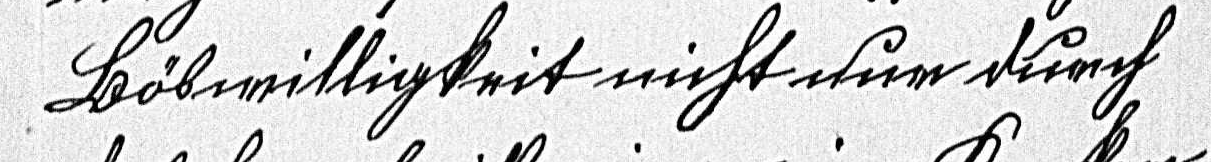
Böswilligkeit nicht nur durch
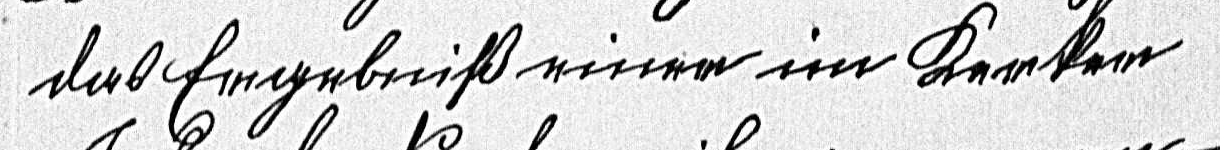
das Ergebniß einer im Kerker
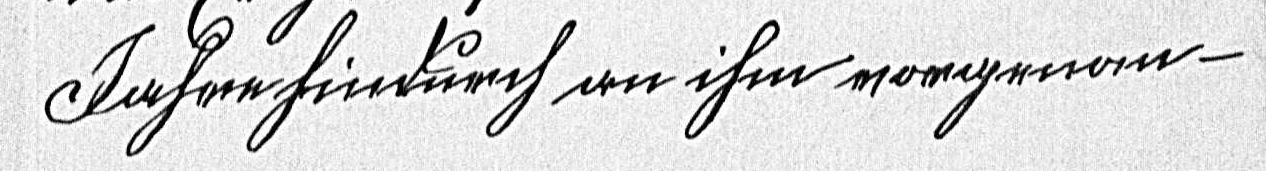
Jahre hindurch an ihm vorgenom¬
